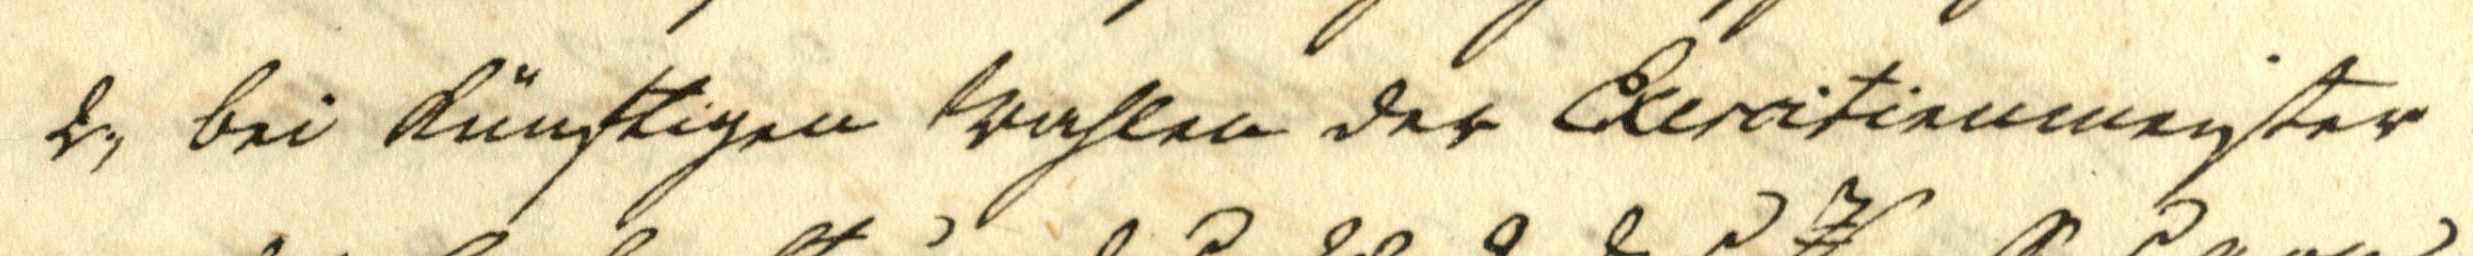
2., bei künftigen Wahlen der Exercitienmeister
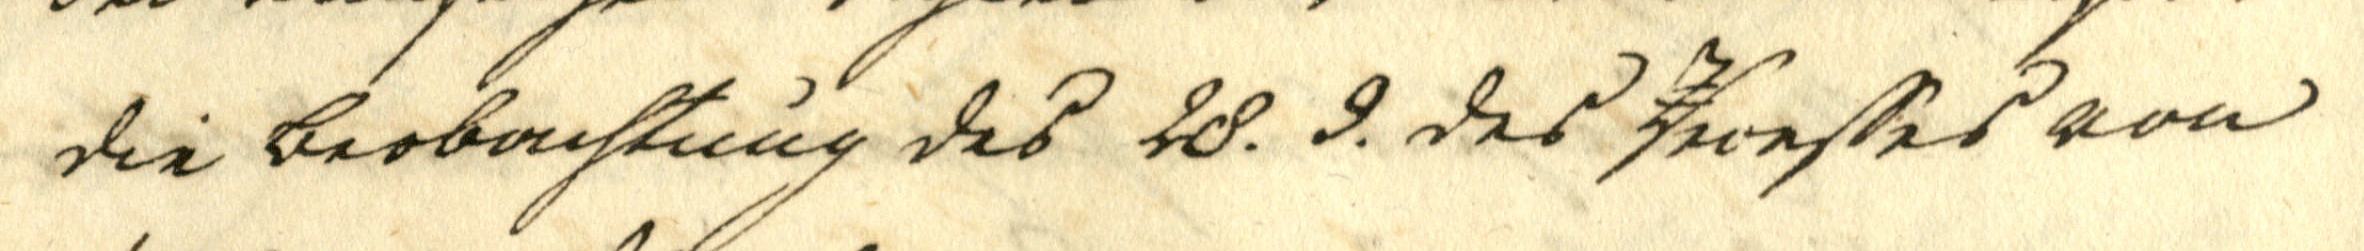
die Beobachung des 28. §. des Recesses von
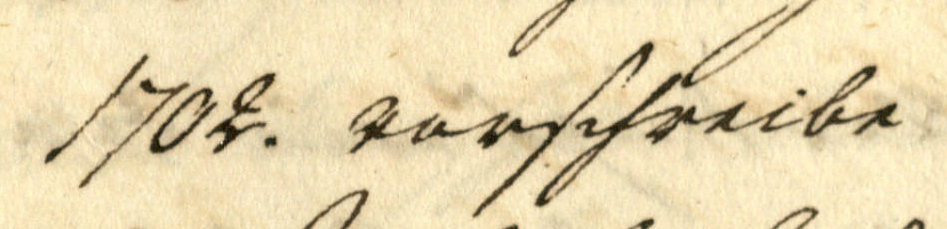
1702. vorschreibe.
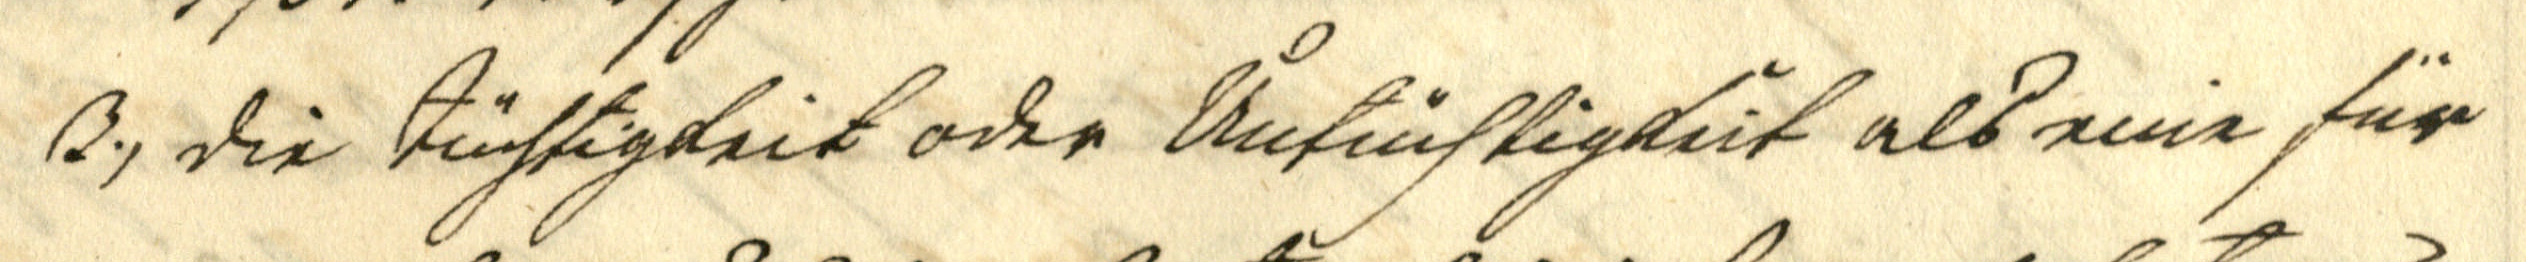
3., die Tüchtigkeit oder Untüchtigkeit als eine für
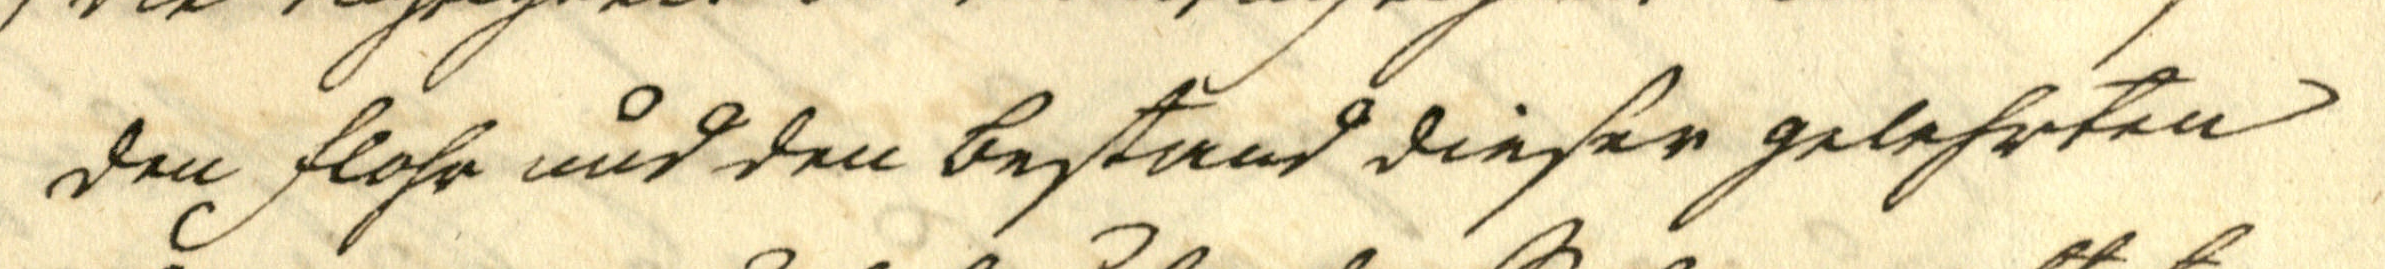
den Flohr und den Bestand dieser gelehrten
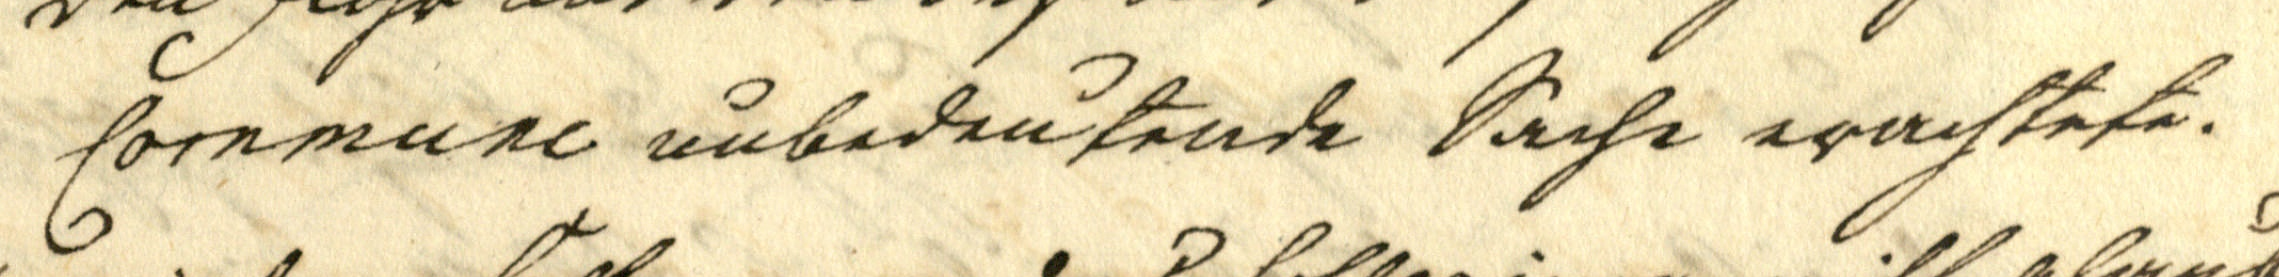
Commune unbedeutende Sache erachtete.
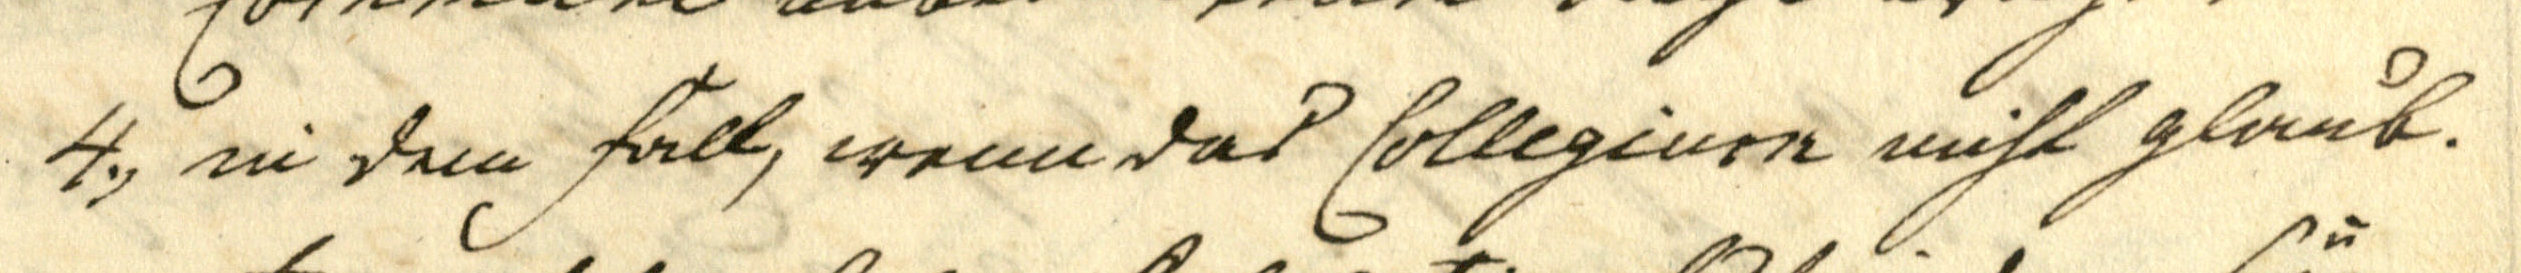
4., in dem Fall, wenn das Collegium nicht glaub¬
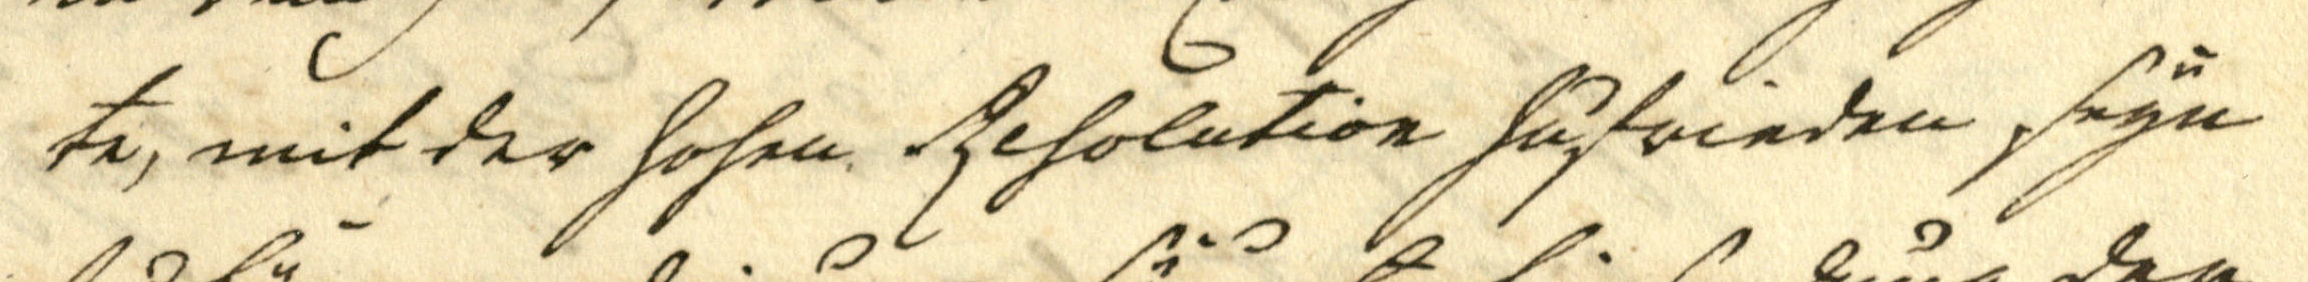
te, mit der hohen Resolution zufrieden seÿn
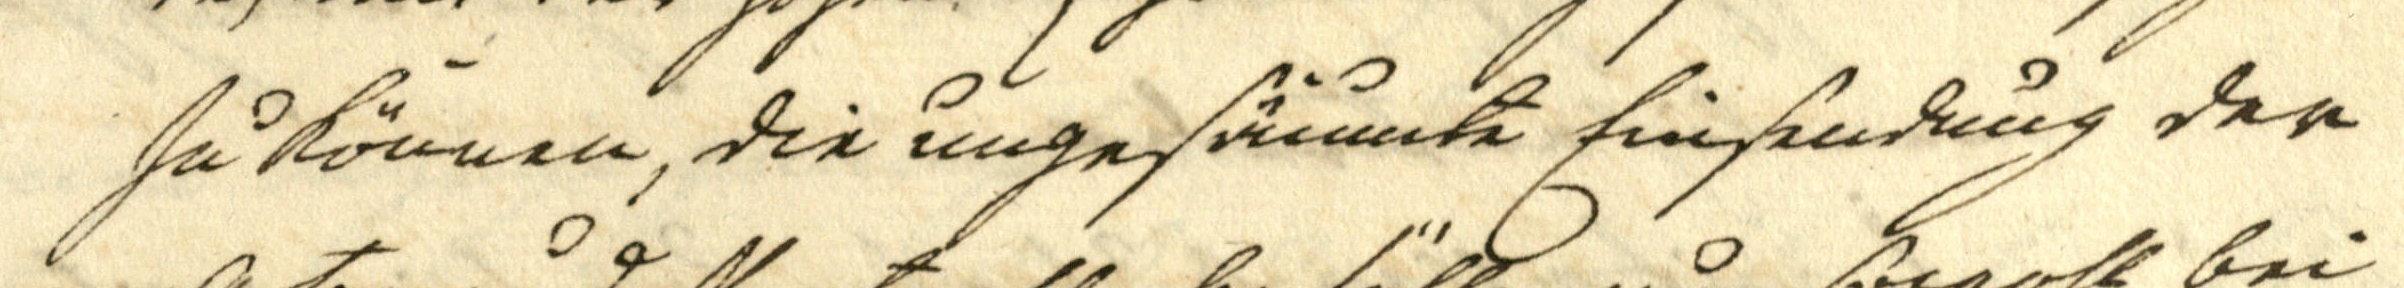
zu können, die ungesäumte Einsendung der
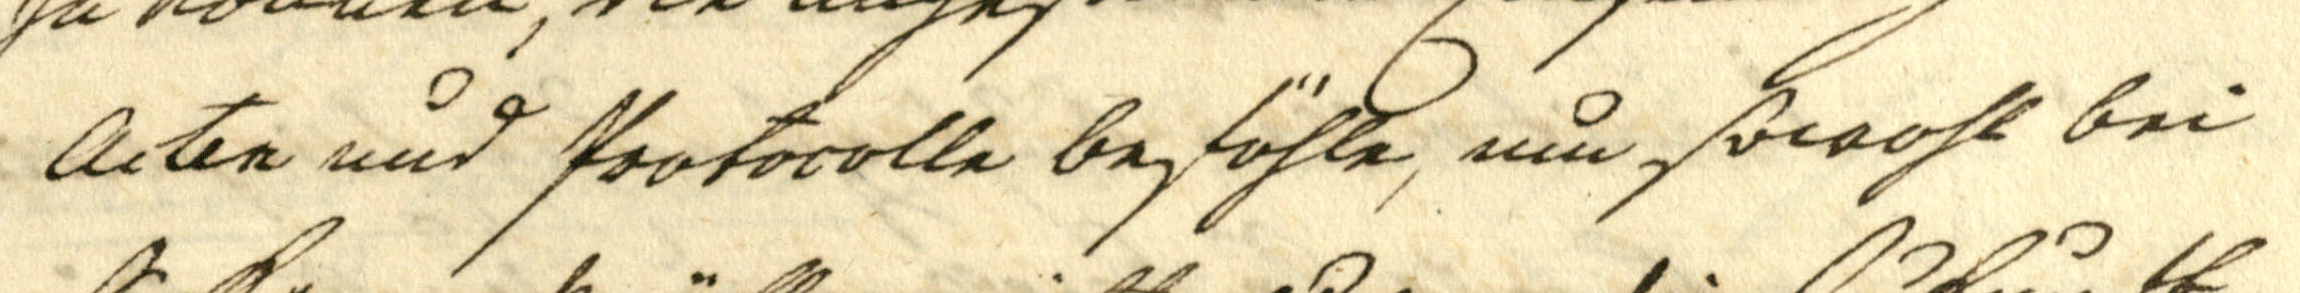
Acten und Protocolle beföhle, um sowohl bei
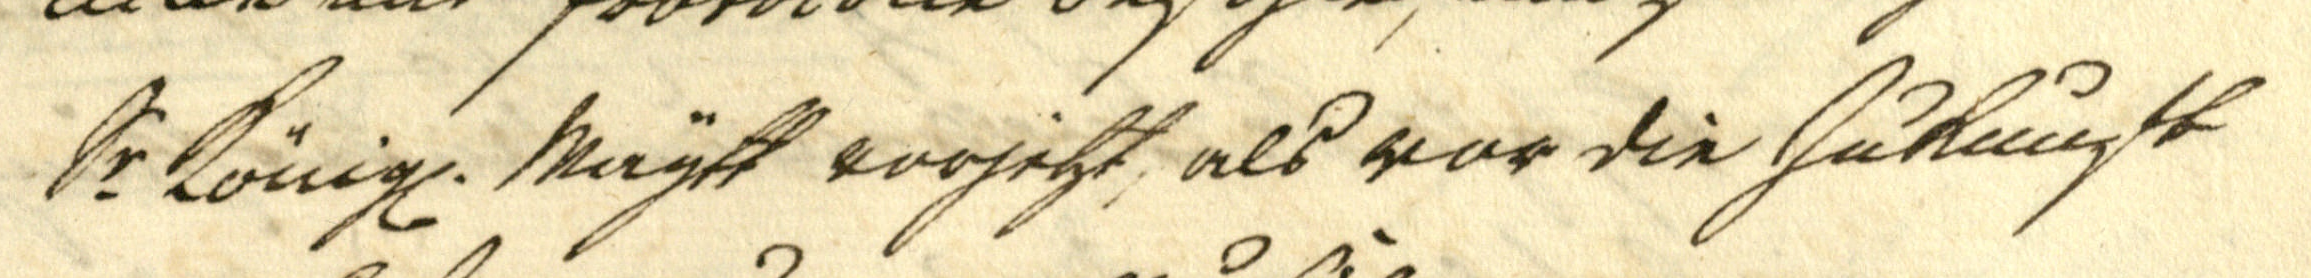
Sr. Königl. Maÿtt vorjetzt, als vor die Zukunft
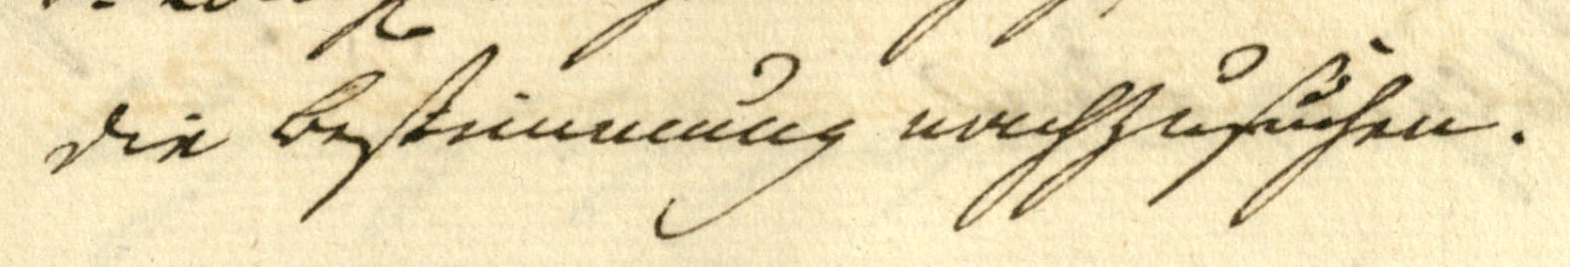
die Bestimmung nachzusuchen.
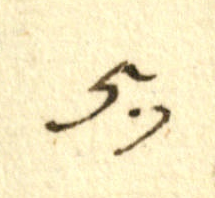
5.,
